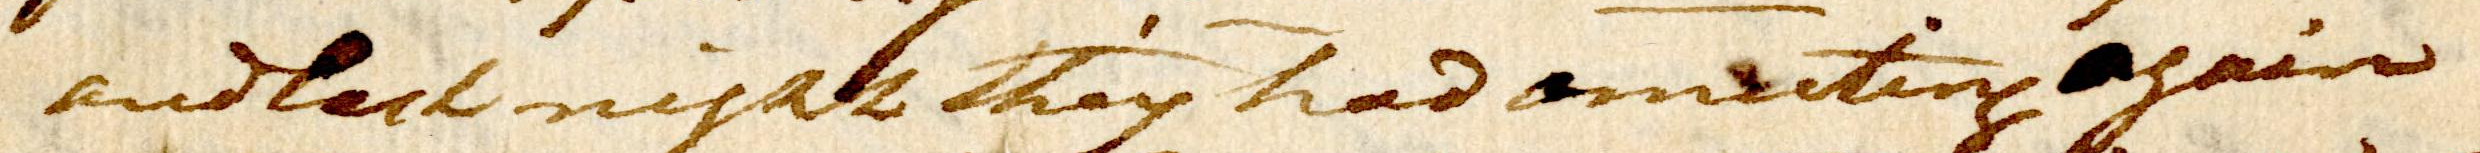and last night they had a meeting again
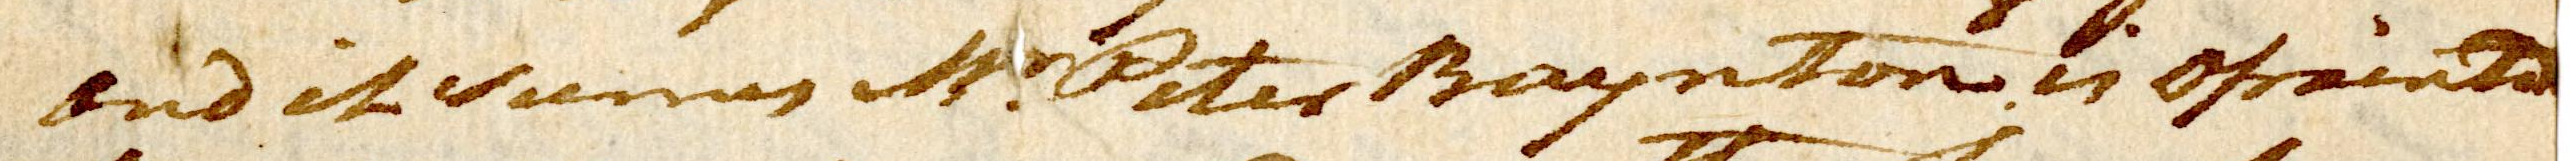and it seems M^r Peter Baynton is apointed
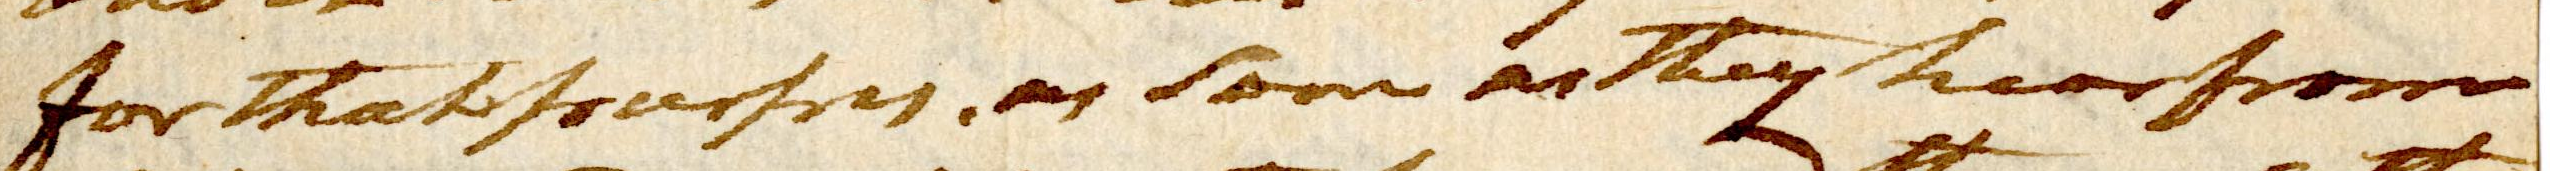for that purpos, as soon as they hear from
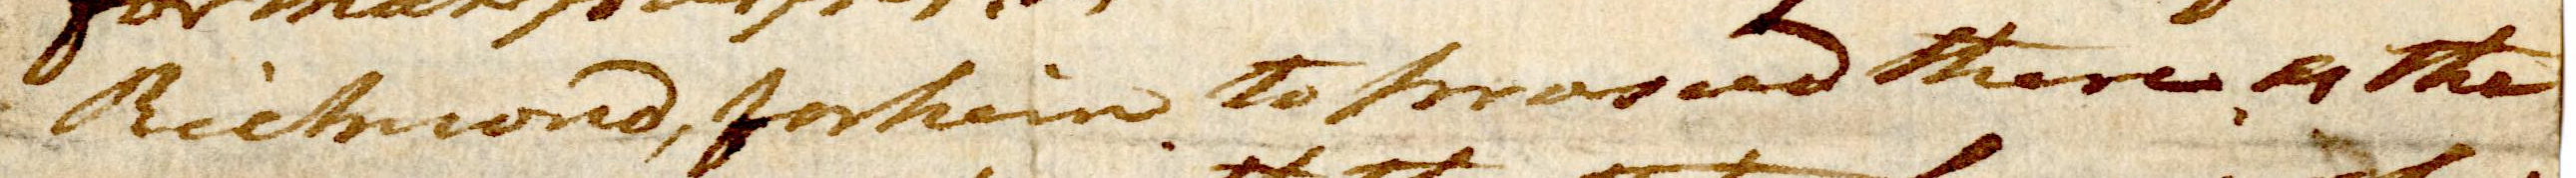Richmond for him to proceed there as the
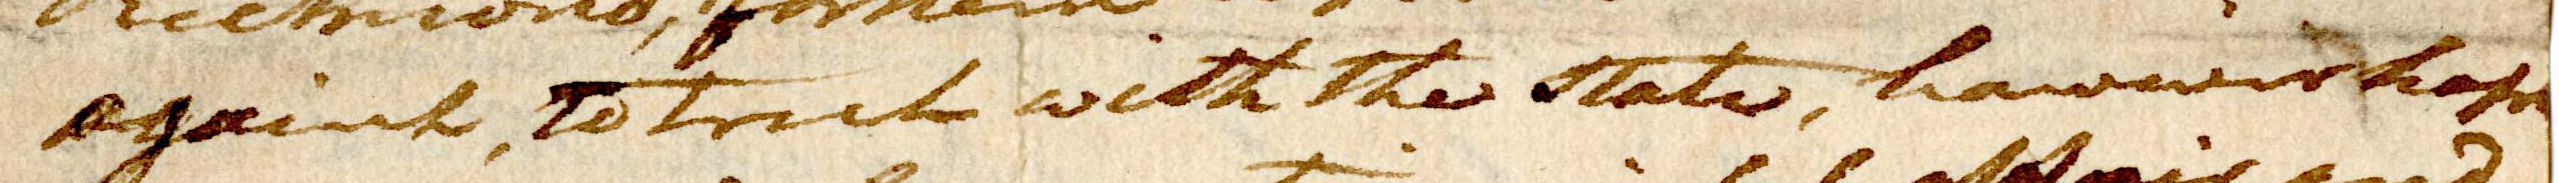against to trust with the state, however hope
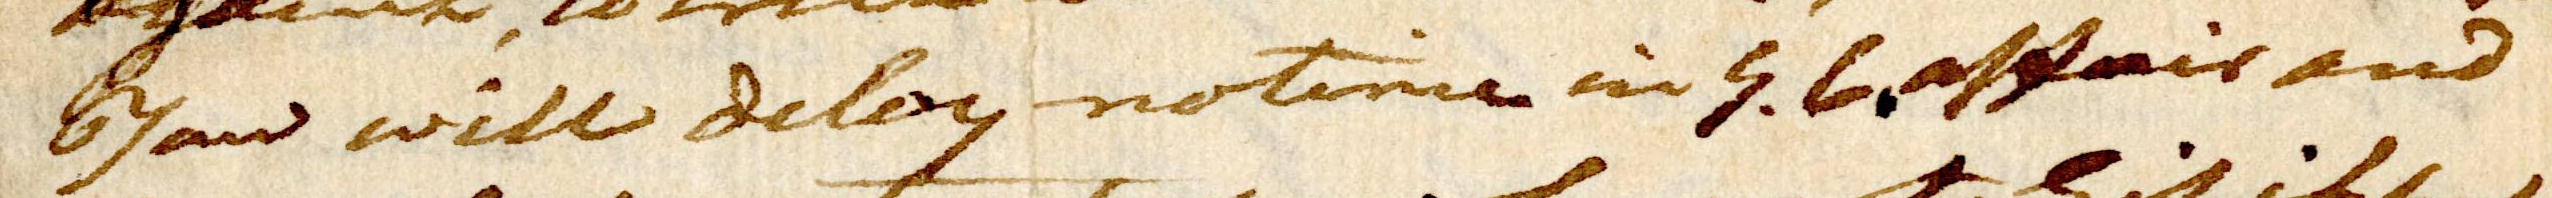you will delay no time in G. C. affair and
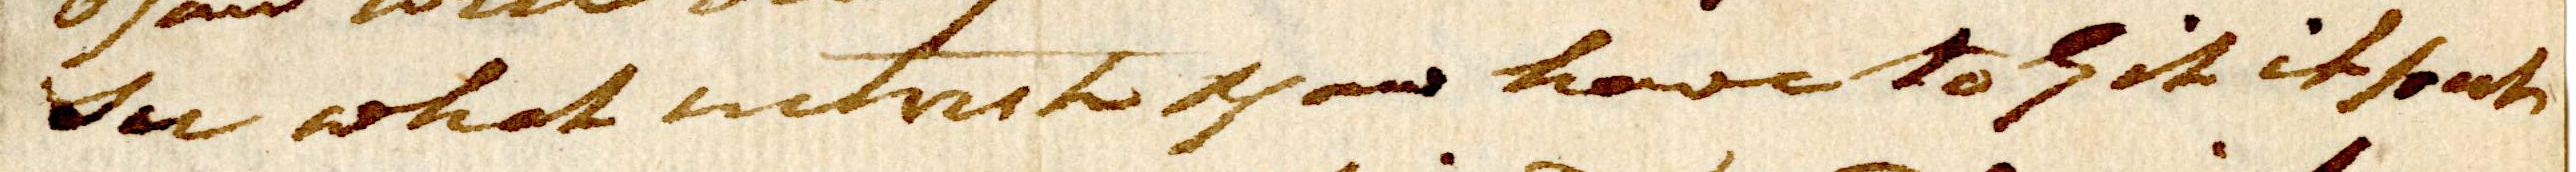see what intrust you have to Git it past
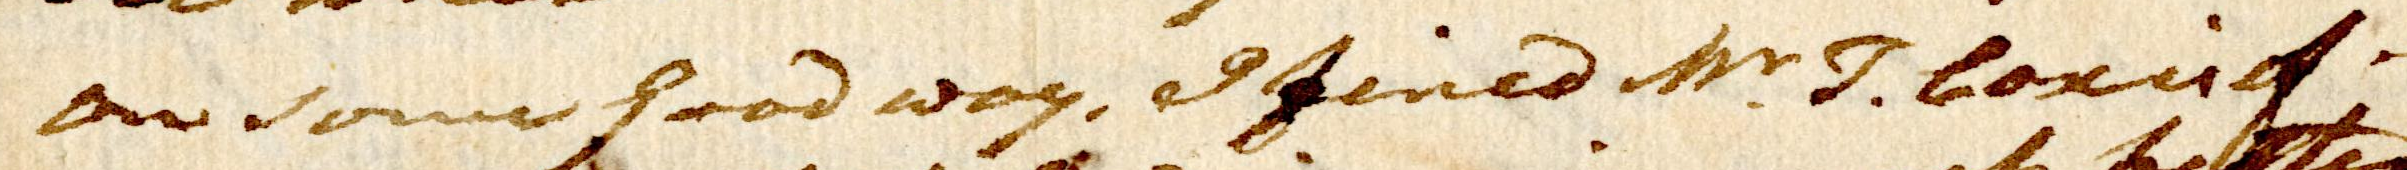on some good way, I fined M^r T. Cox is of
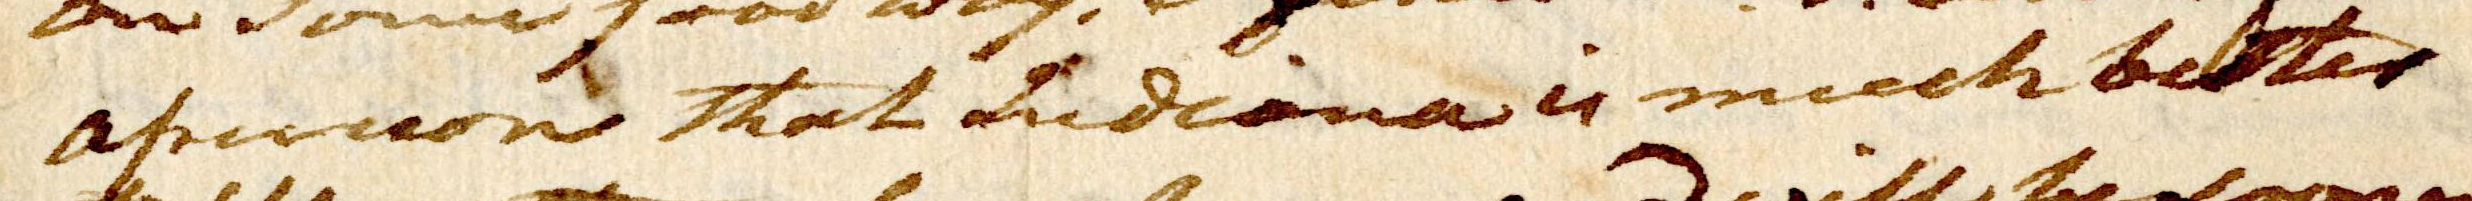a person that Indiana is much better
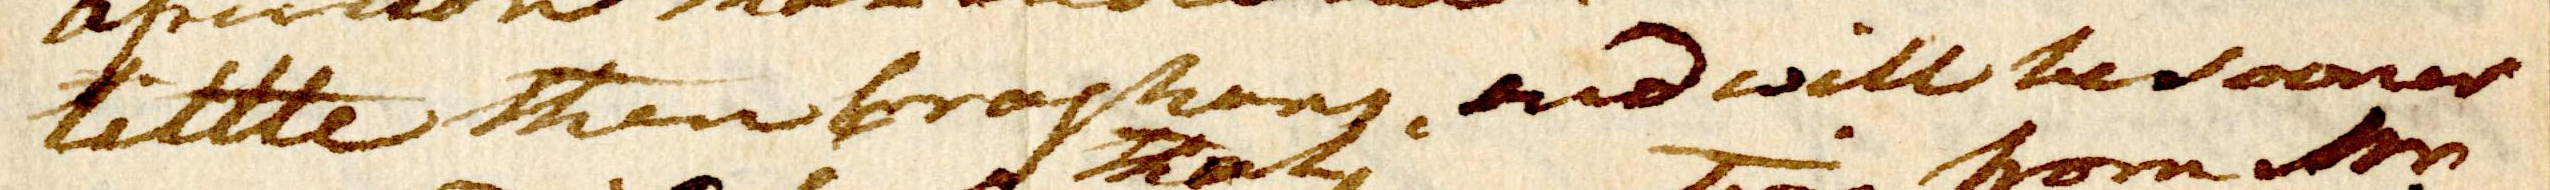little then Croghan. and will be sooner
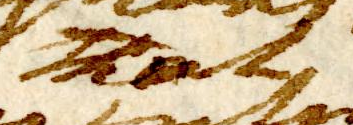that
